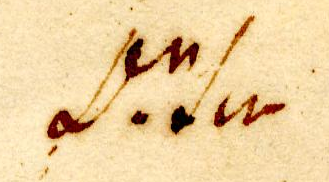D^r Sir
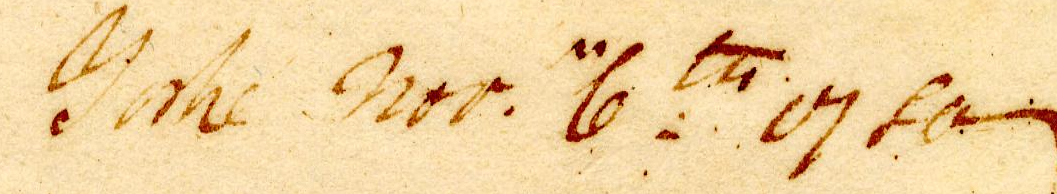Yorke Nov. 6^th. 1780
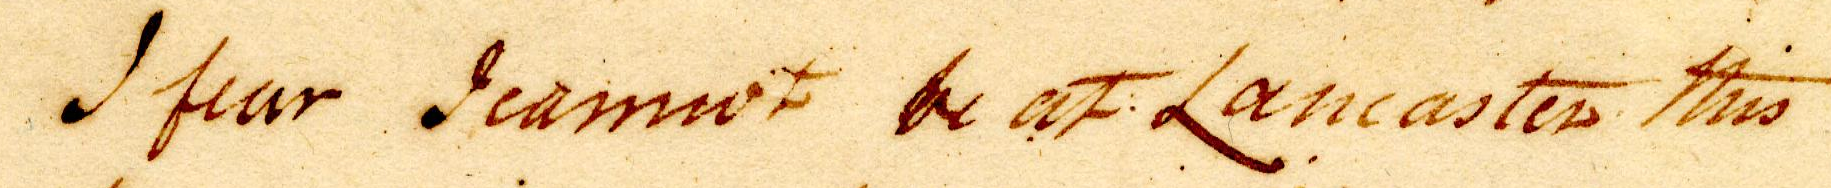I fear I cannot be at Lancaster this
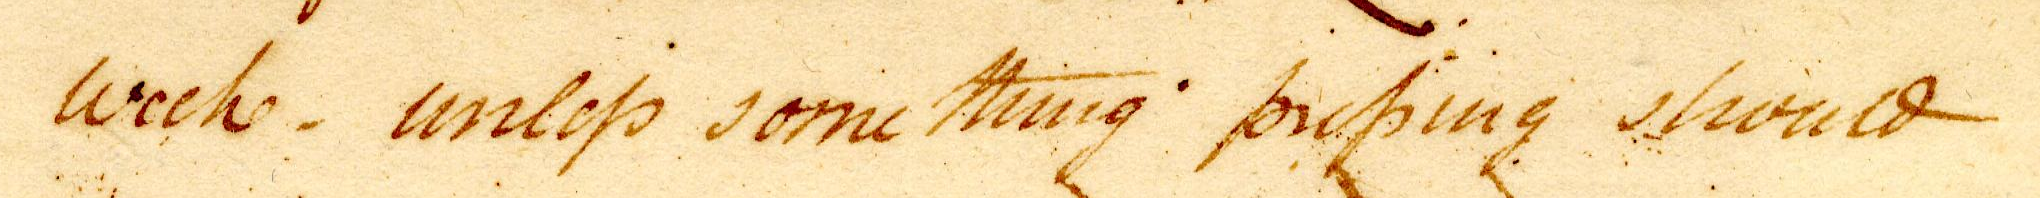week. unless something pressing should
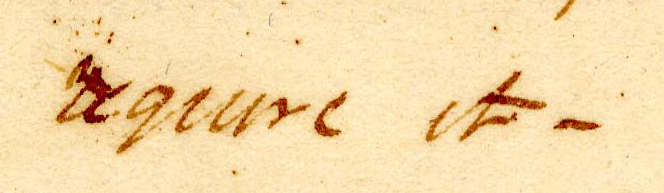acquire it.
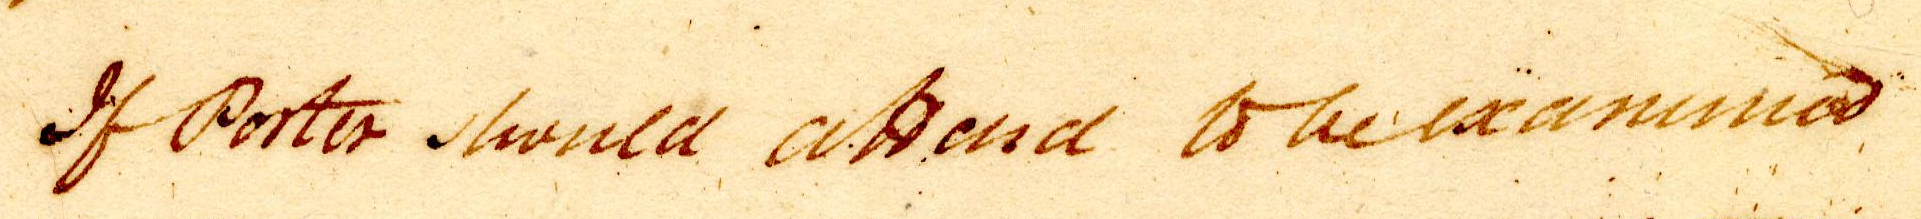If Porter should attend to be examined
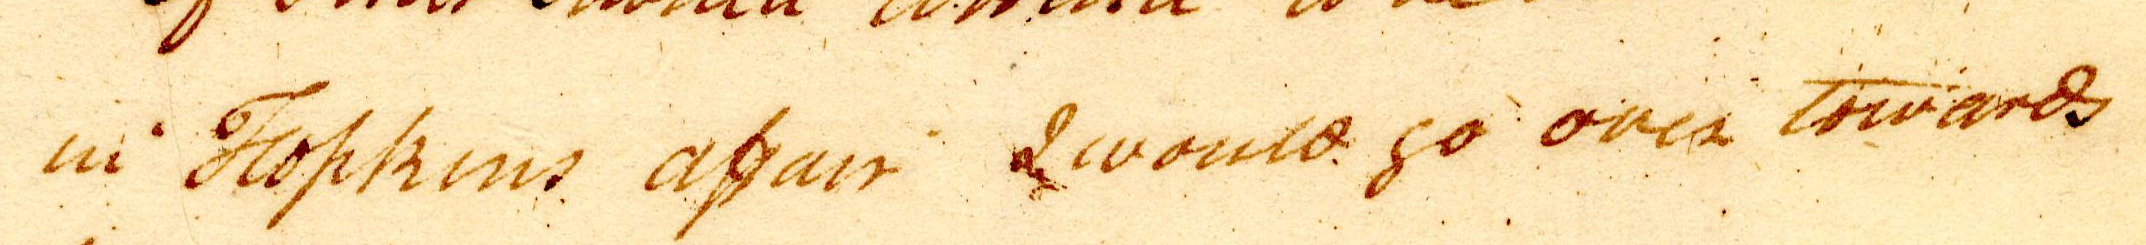in Hopkins affair I would go over towards
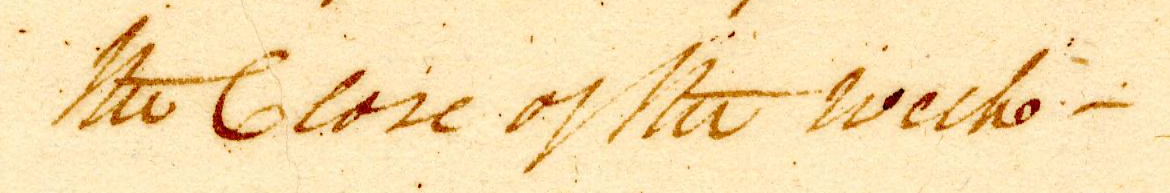the Close of the week.
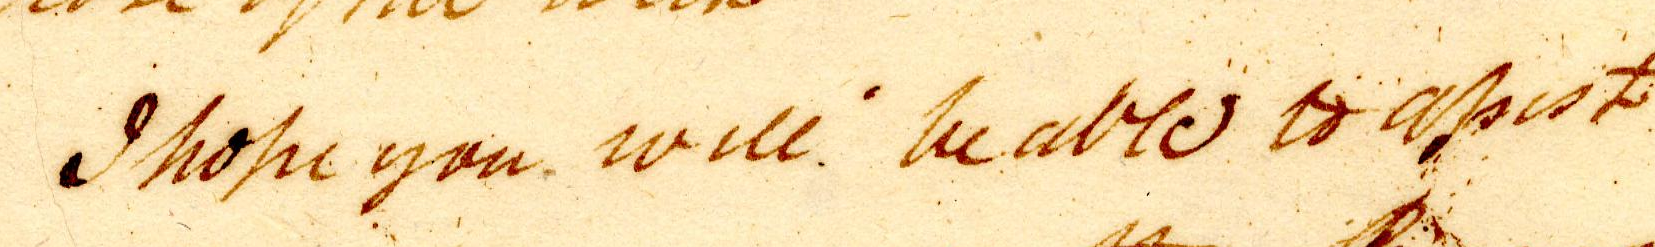I hope you will be able to assist
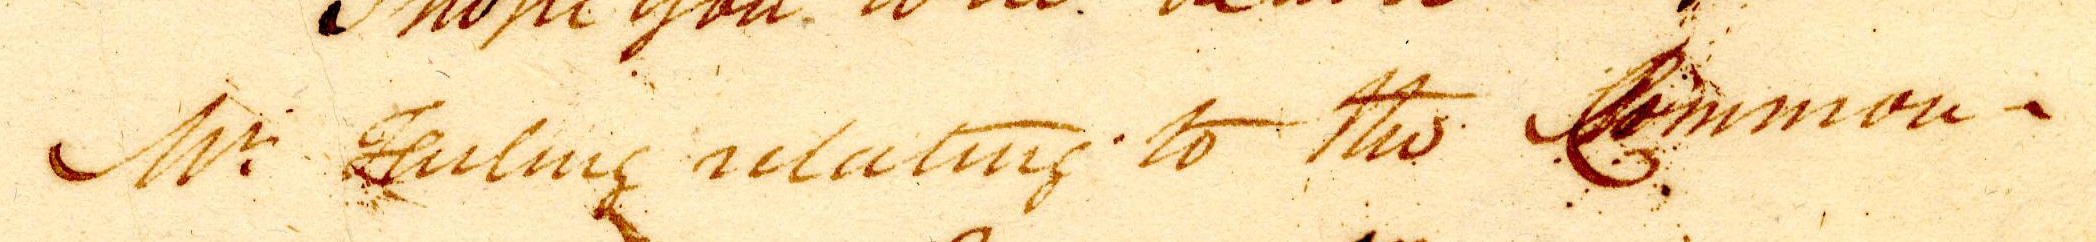M^r. Huling relating to the Commorn
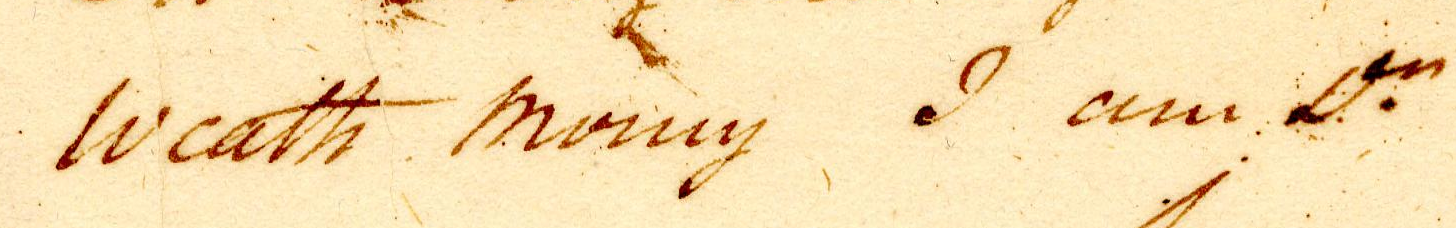Weath Money I am D^r.
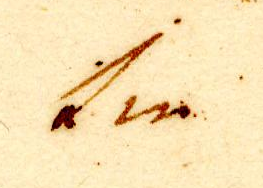Sir
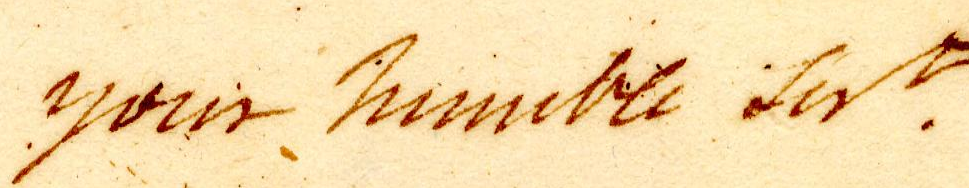your humble Ser^t
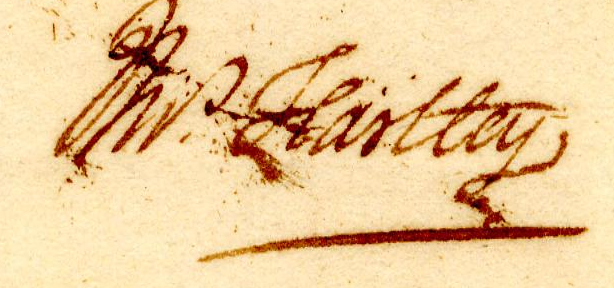M^r. Hartley
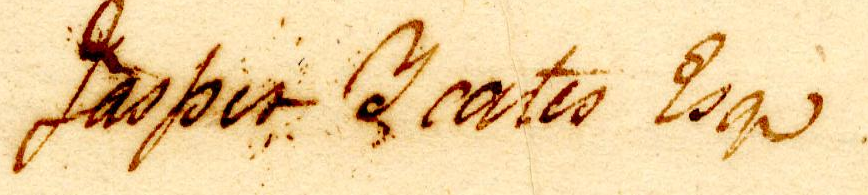Jasper Yeates Esq.
